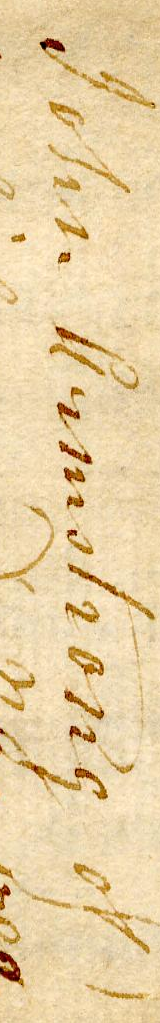John Armstrong of
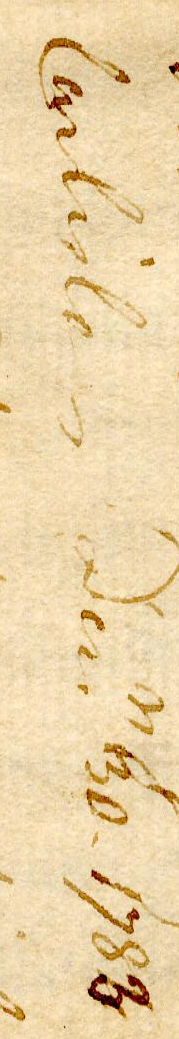Carlisle dec^r. 30. 1783
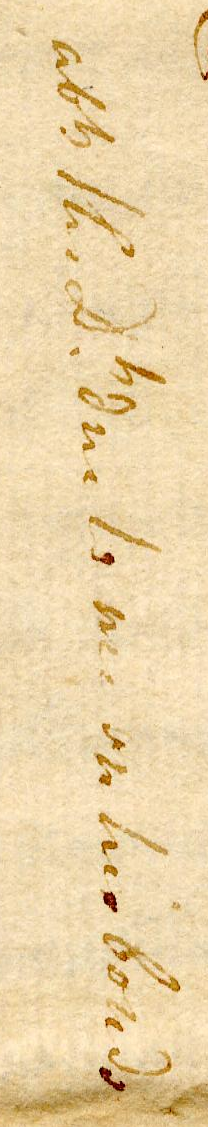ab^t. the. D^t. due me on his bonds
